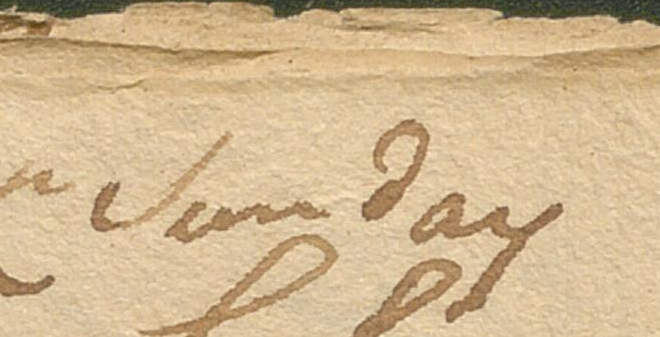Sunday
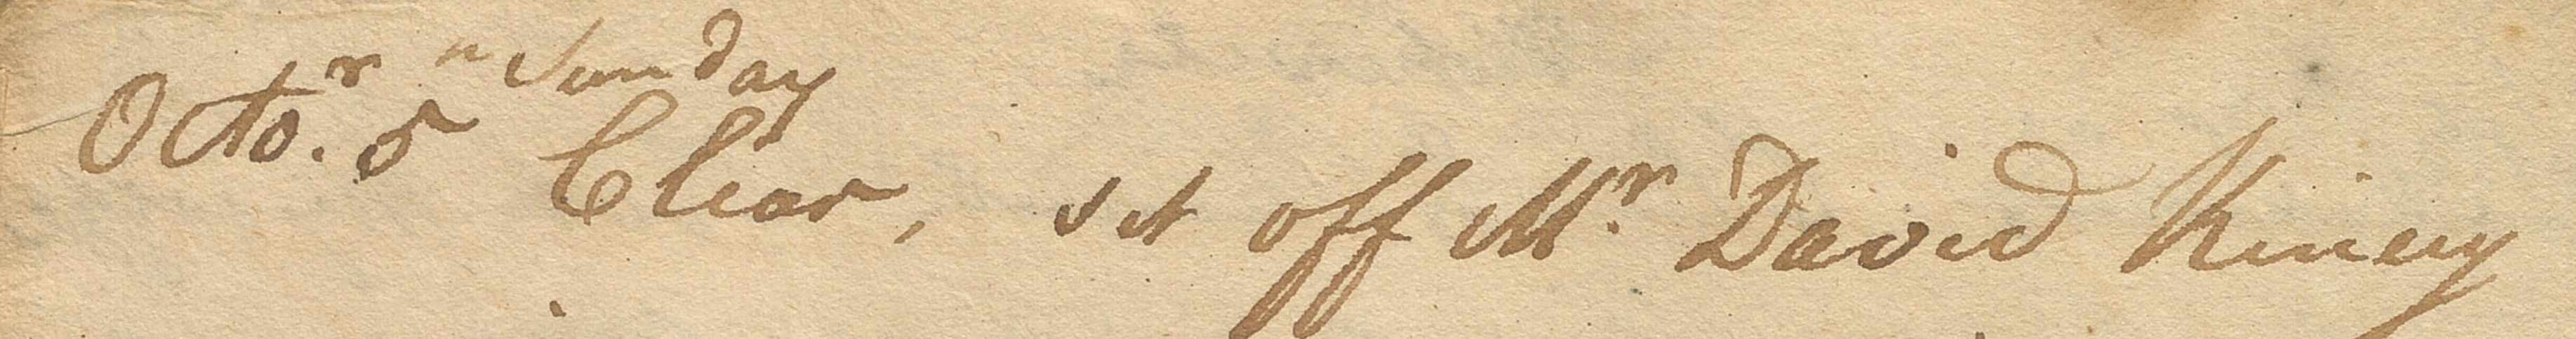Octo^r. 5^th Clear, set off M^r. Daved Kiney
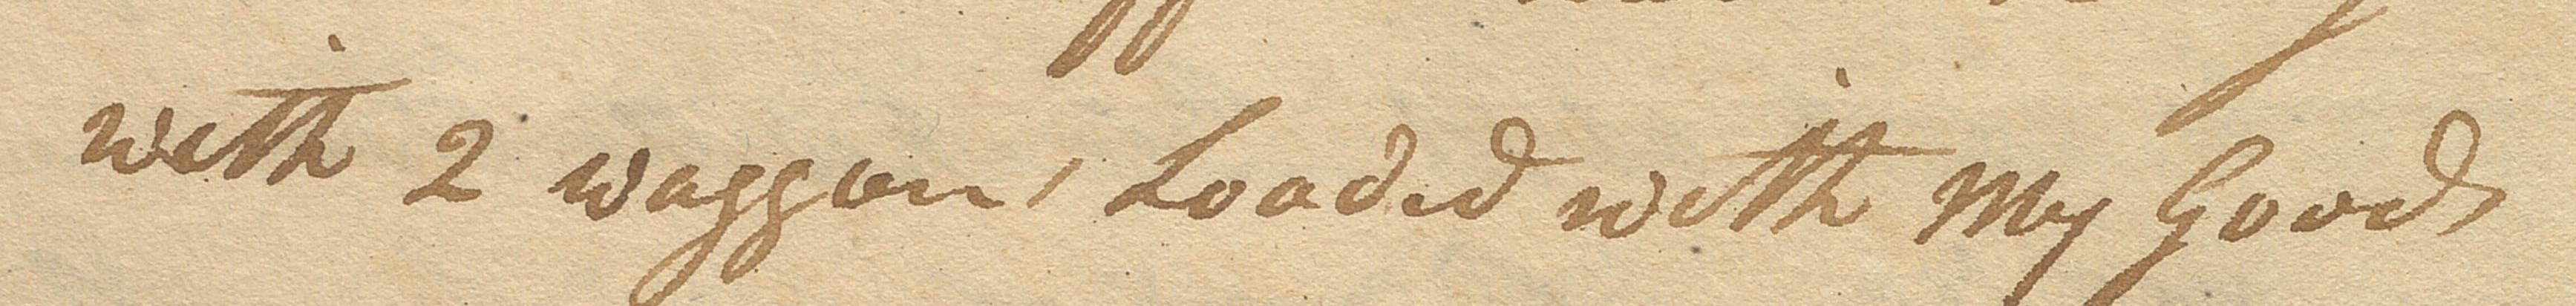with 2 waggons Loaded with My Goods
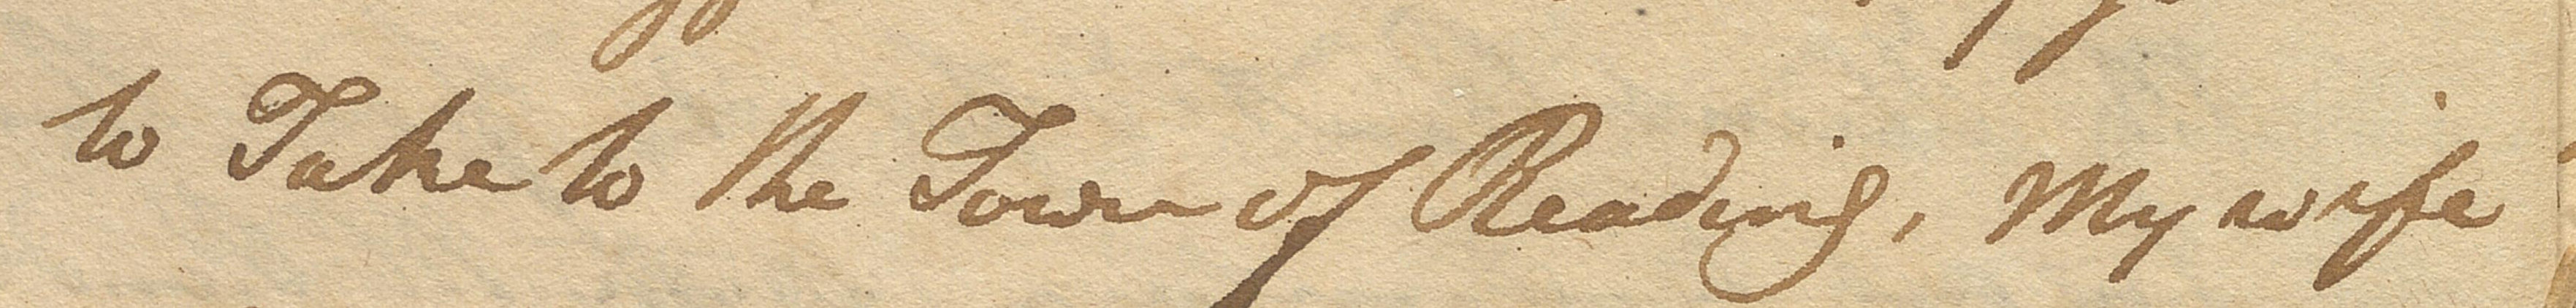to Take to the Town of Reading. My wife
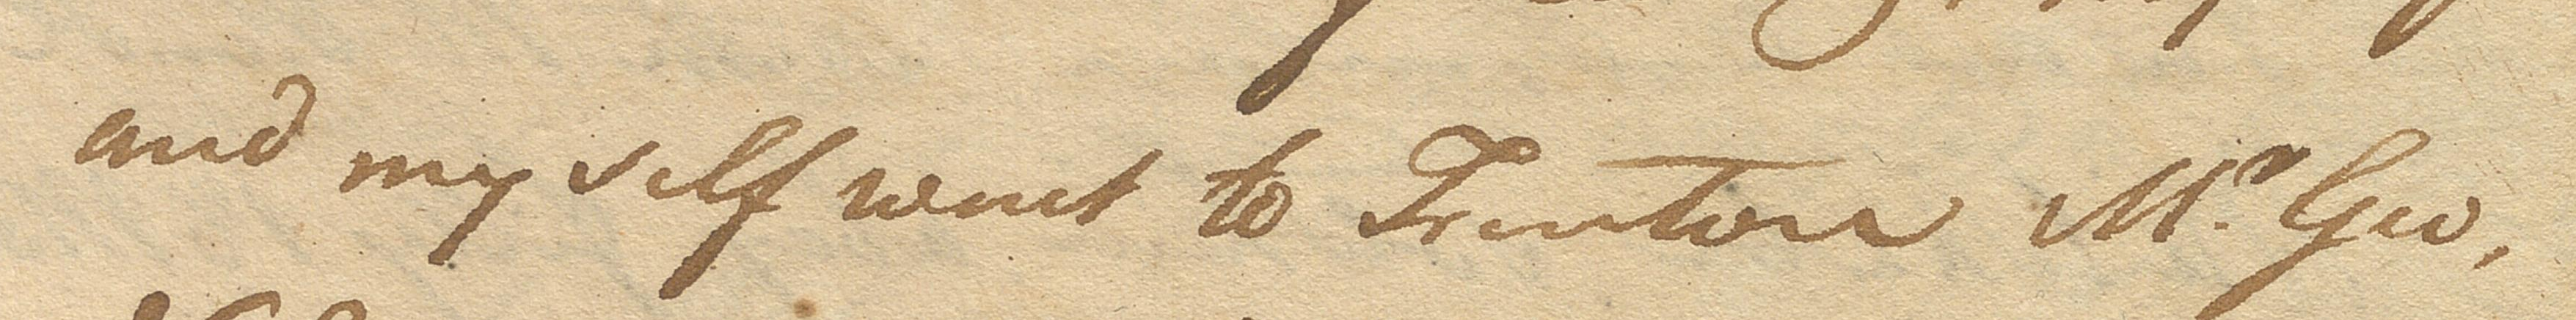and my self went to Trenton M^r. Geo.
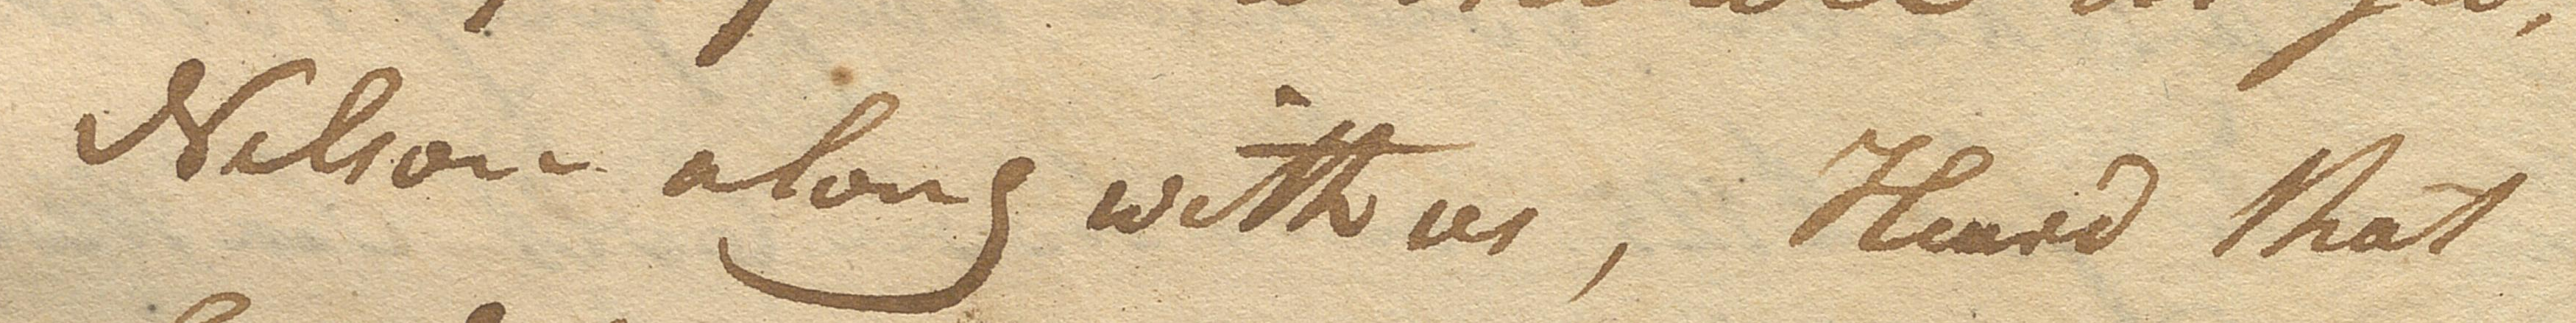Nelson along with us, Herd that
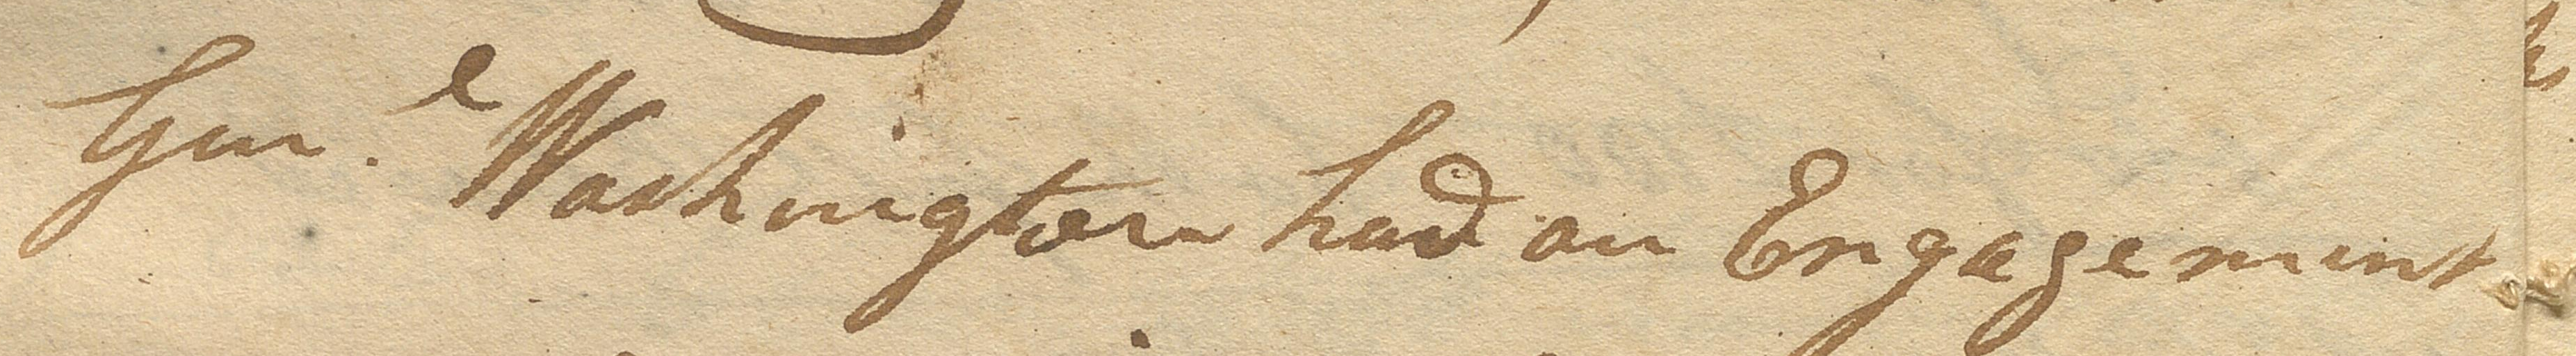Gen^l. Washington had an Engagement
